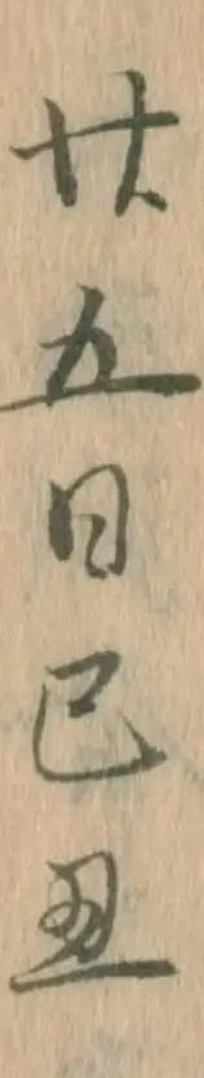廿五日己丑
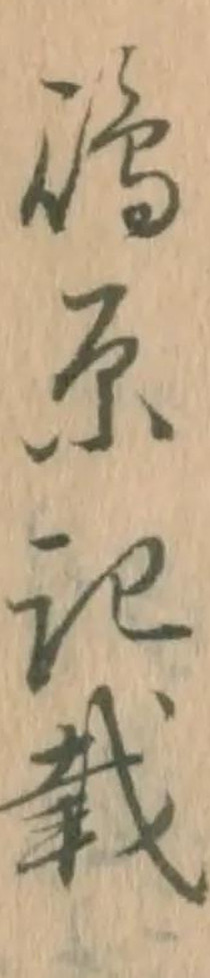島原記載
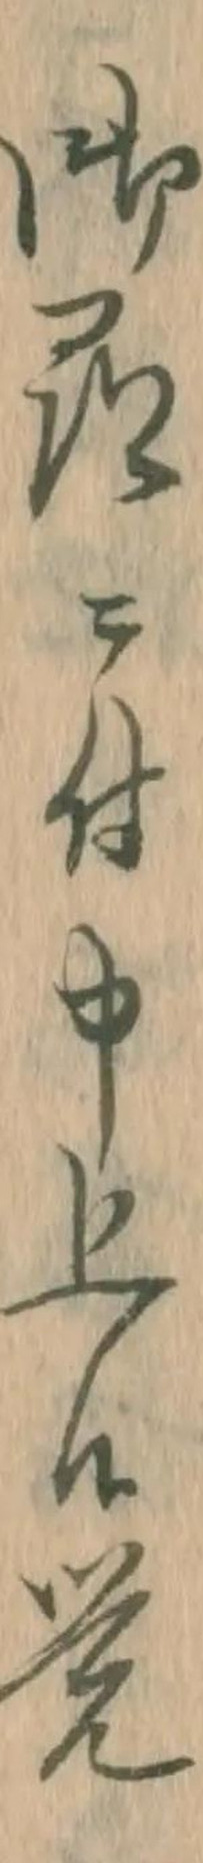御尋に付申上候覚
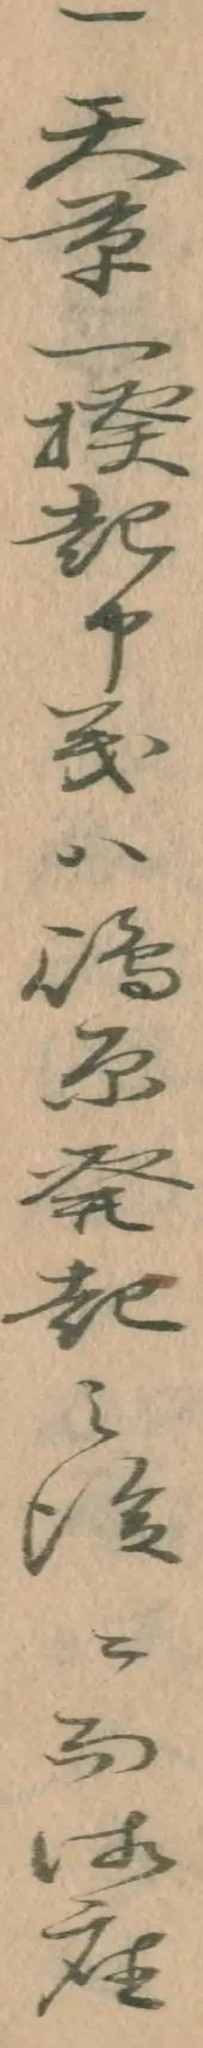一天草一揆起申義は島原発起之後に而御座
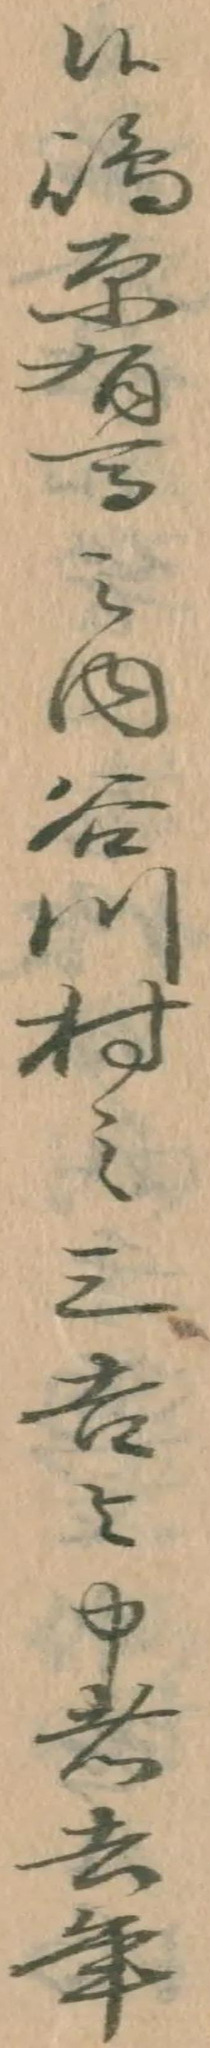候島原有馬之内谷川村之三吉与申者去年
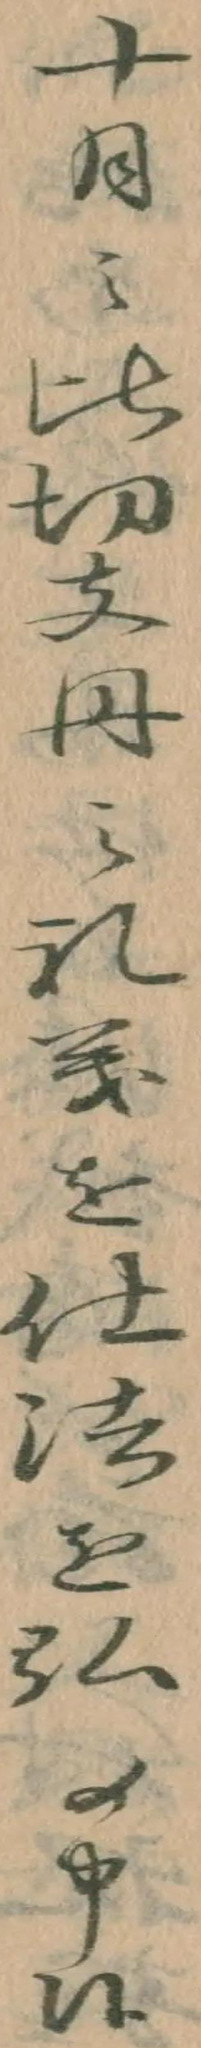十月之比切支丹之礼義を仕法を弘め申候
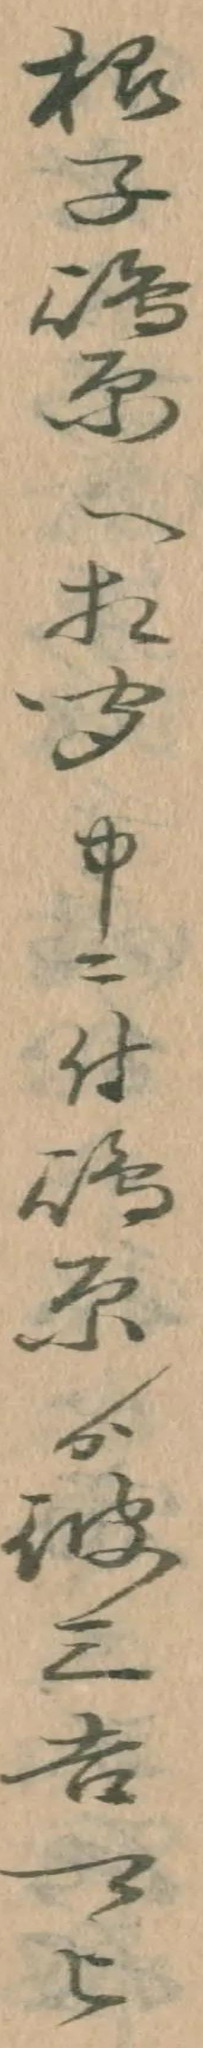様子島原へ相聞申に付島原ゟ彼三吉可被
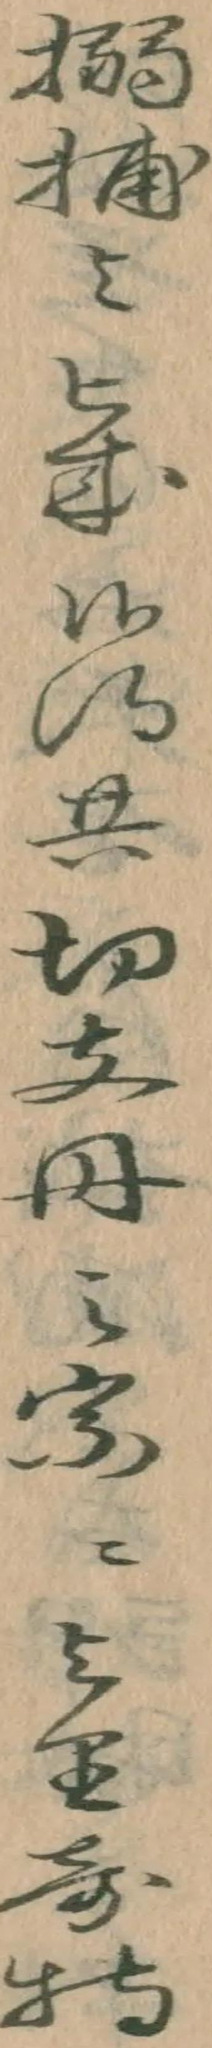搦捕与被成候得共切支丹之宗に与里寄物
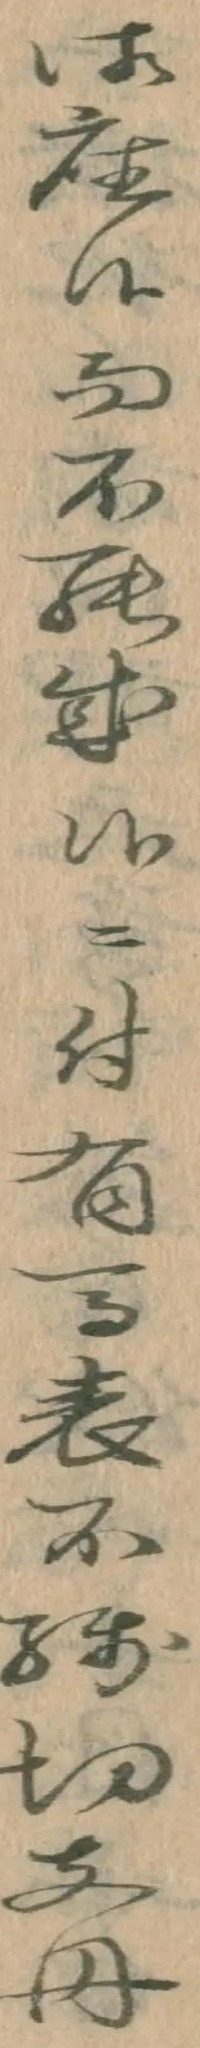御座候而不罷成候に付有馬表不残切支丹
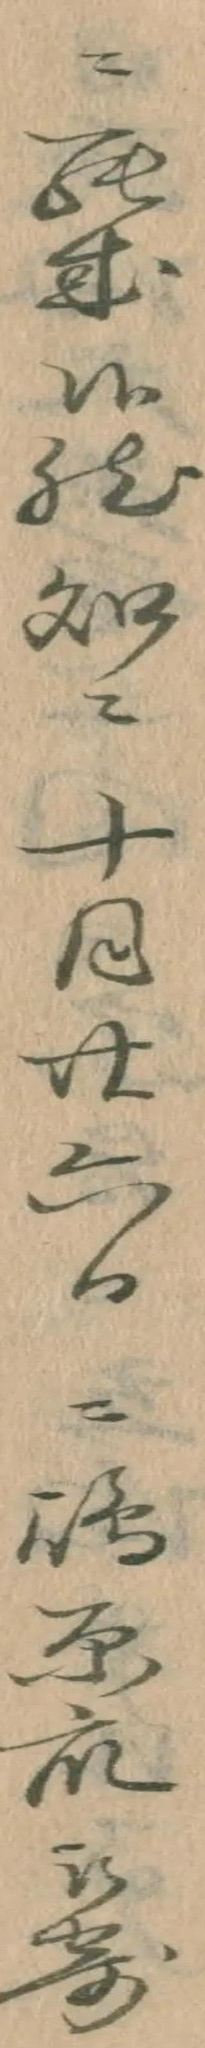に罷成候然処に十月廿六日に島原衆被寄
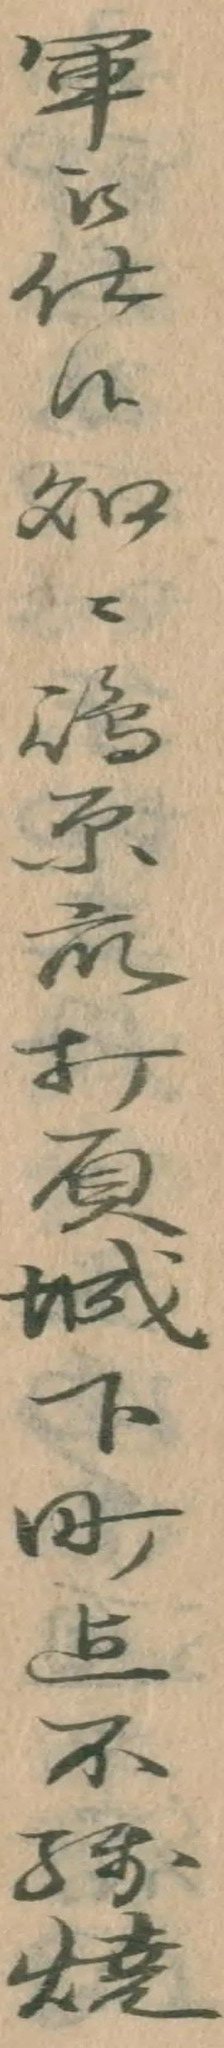軍被仕候処に島原衆打負城下町迄不残焼
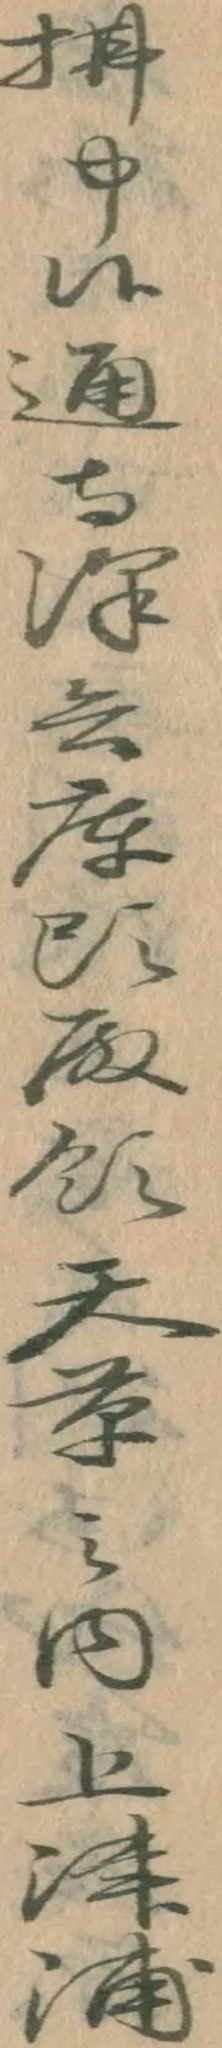払申候通寺沢兵庫頭殿領天草之内上津浦
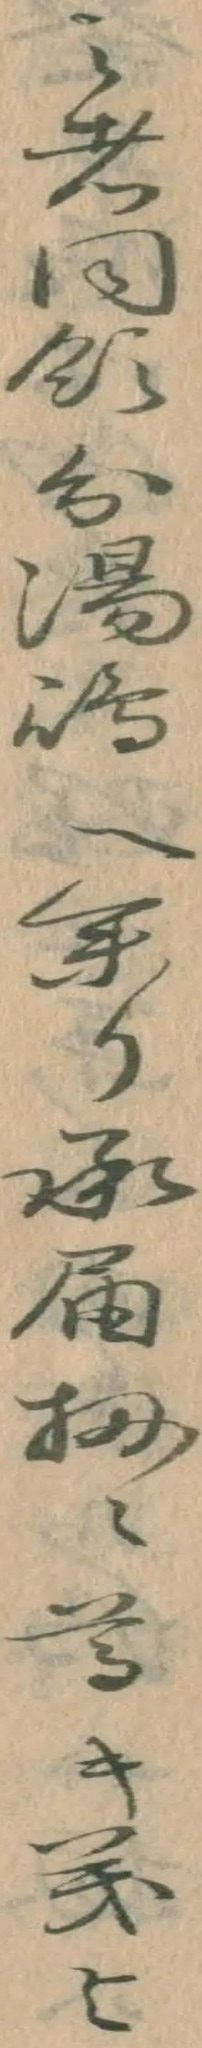之者同領分湯島へ参り承届扨々尊き義与
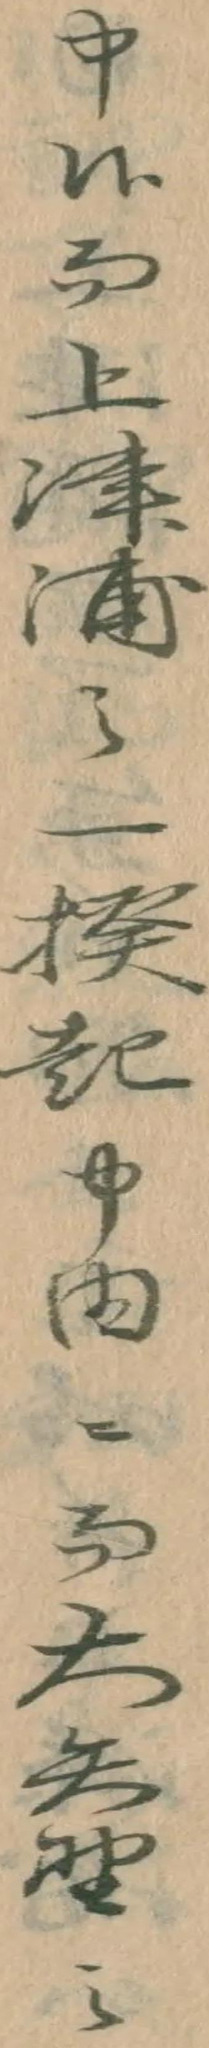申候而上津浦之一揆起申由に而大矢野之
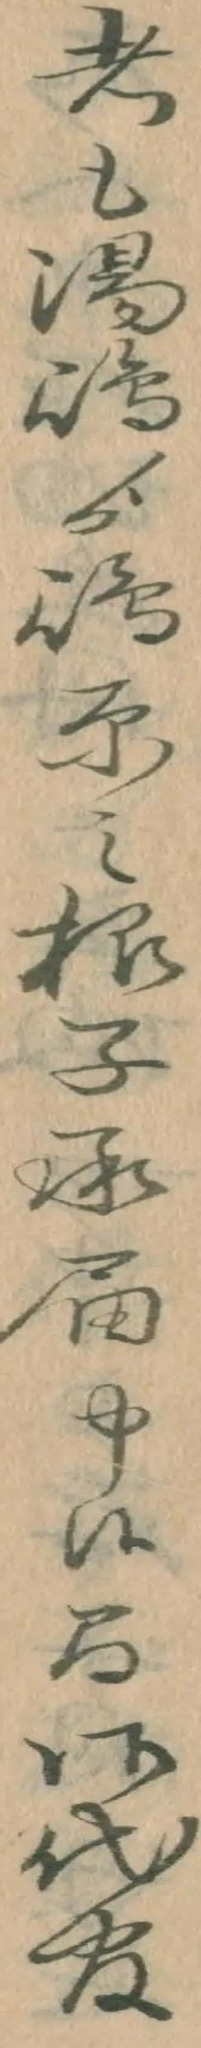者も湯島ゟ島原之様子承届申候間御代官

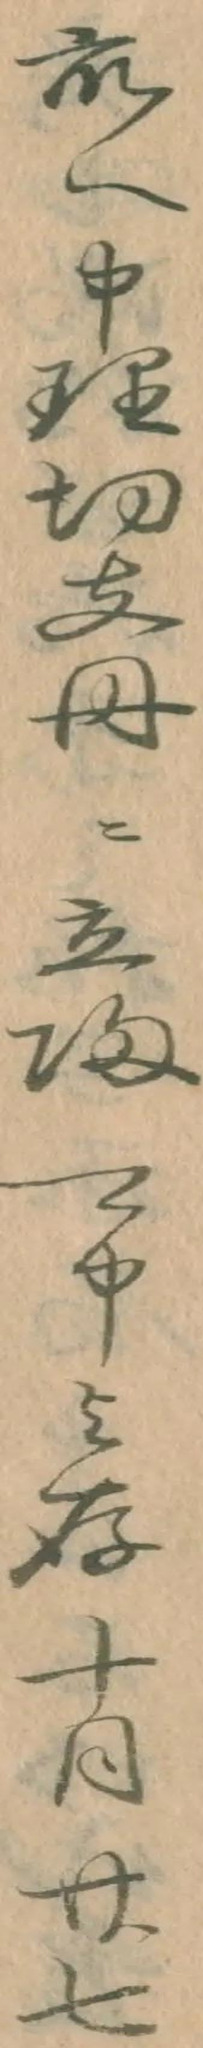衆へ申理切支丹に立帰可申与存十月廿七
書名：切支丹御退治記 49巻. [6]
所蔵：国立国会図書館 National Diet Library, JAPAN
